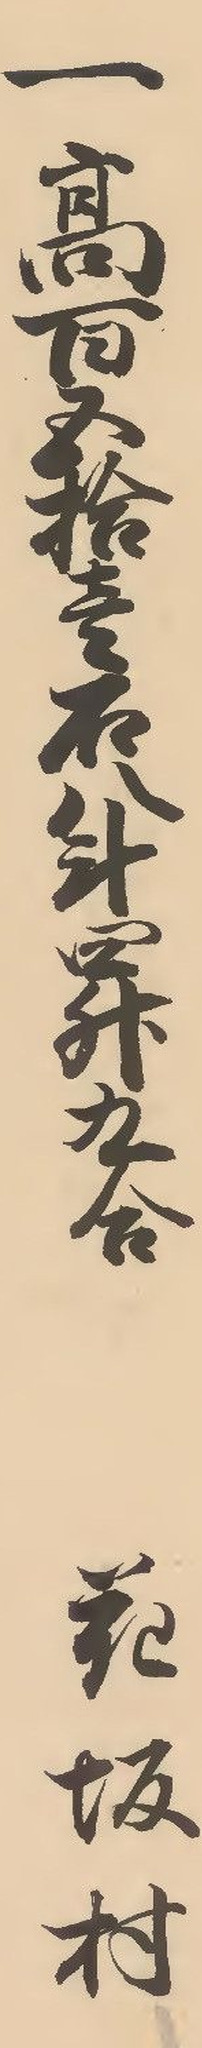一高百五拾壱石八斗四升九合花坂村
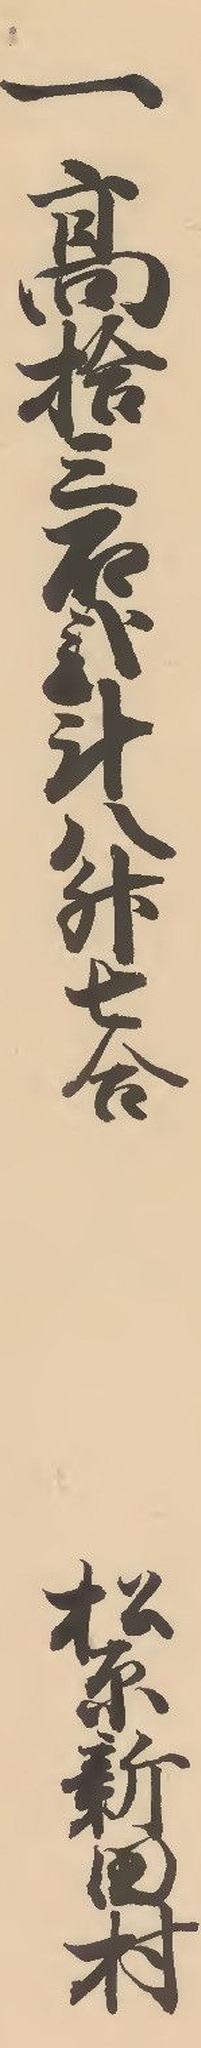一高拾三石弐斗八升七合松新田村
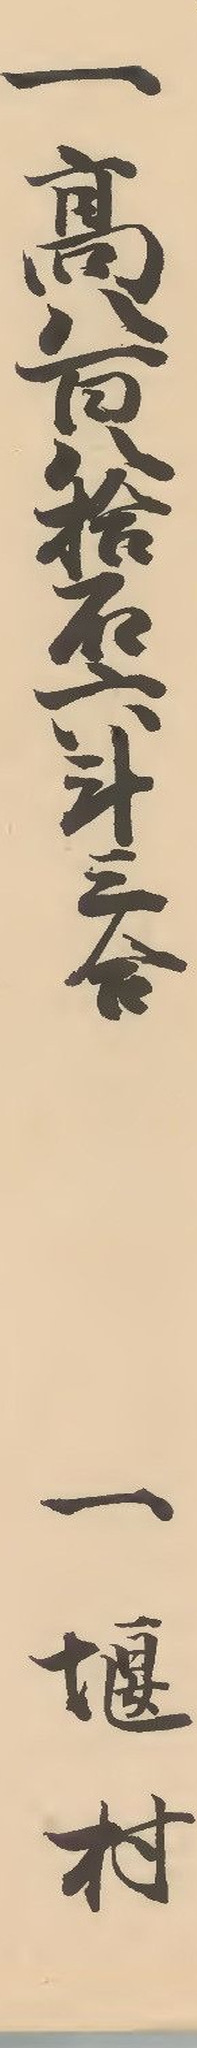一高八百八拾石六斗三合一堰村
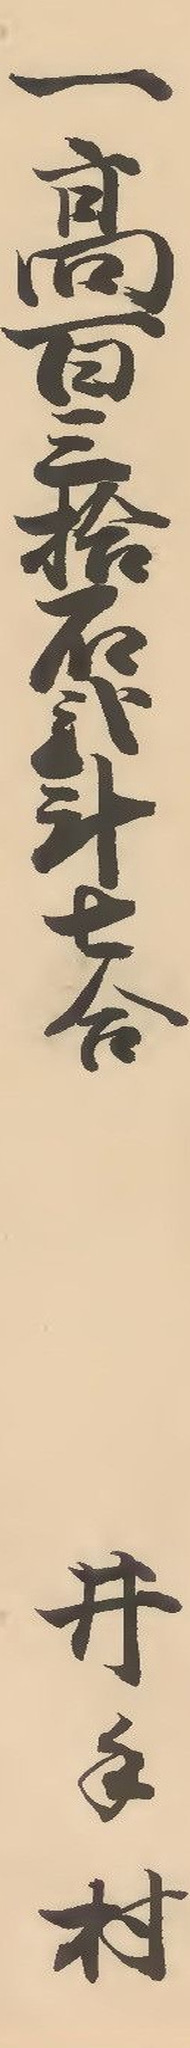一高百三拾石弐斗七合井手村
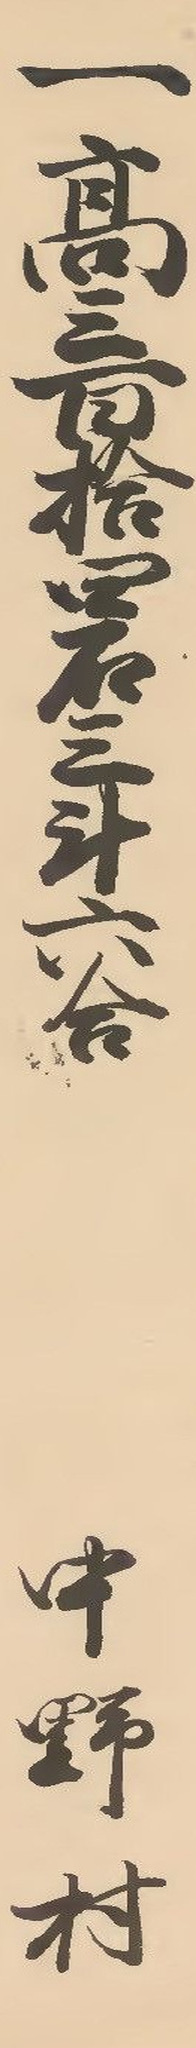一高三百拾四石三斗六合中野村
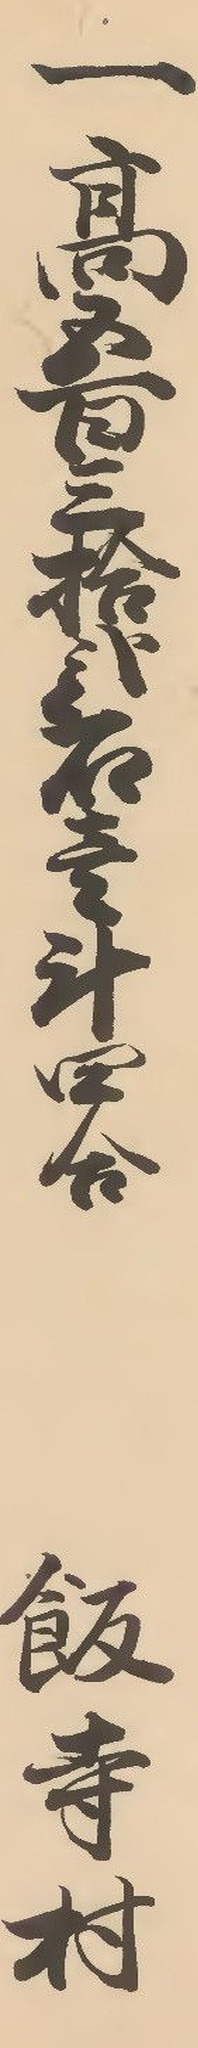一高五百三拾弐石壱斗四合飯寺村
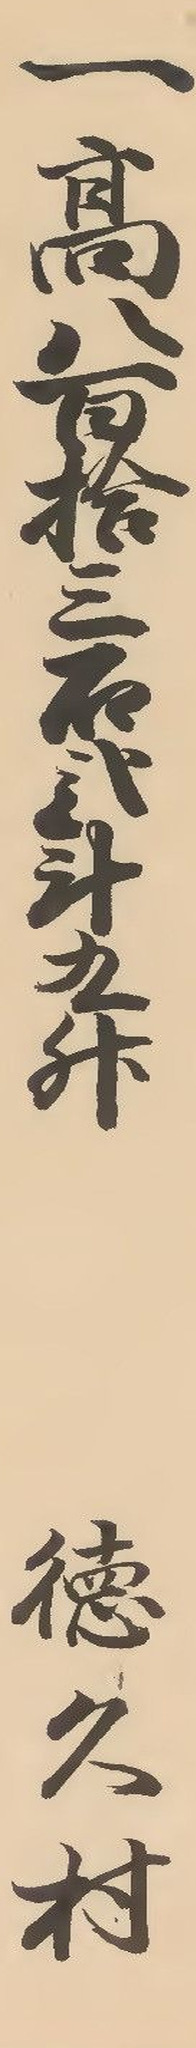一高八百拾三石弐斗九升徳久村
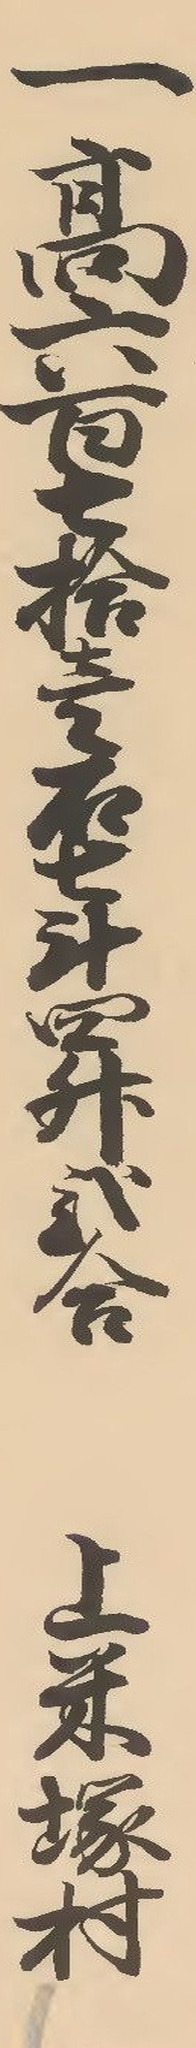一高六百七拾壱石七斗四升弐合上米塚村

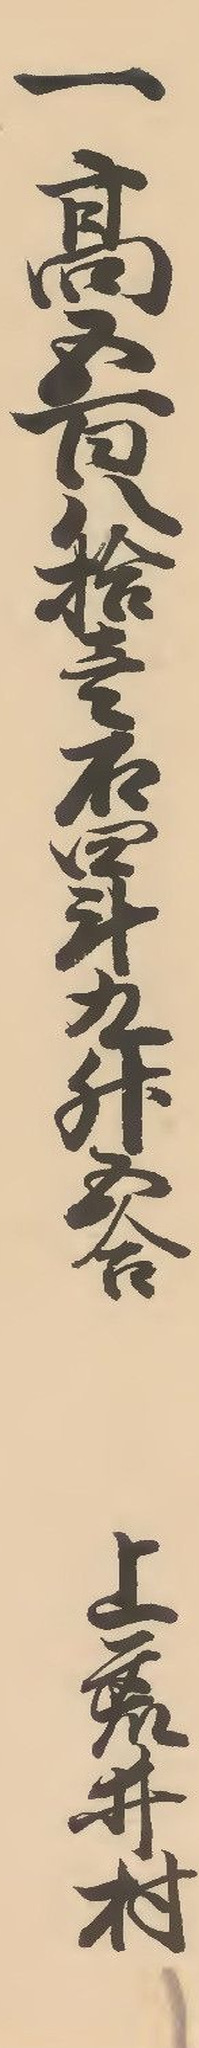一高五百八拾壱石四斗九升五合上荒井村
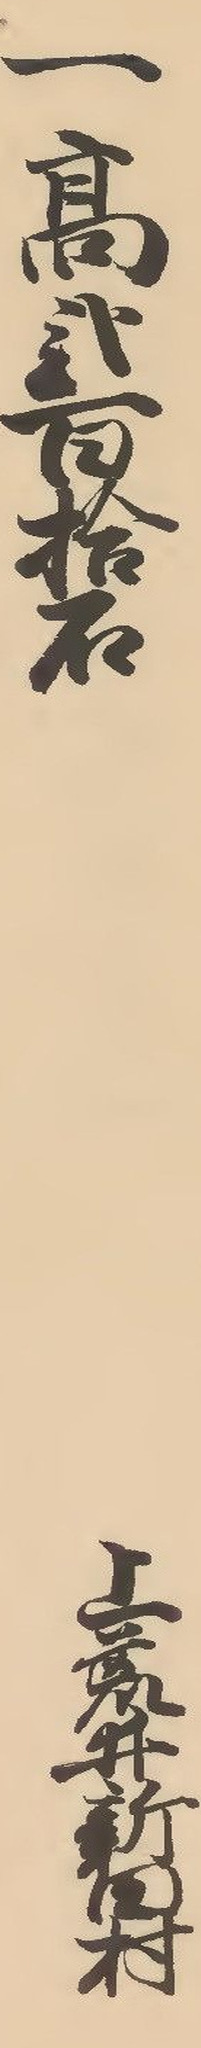一高弐拾石上荒井新田村
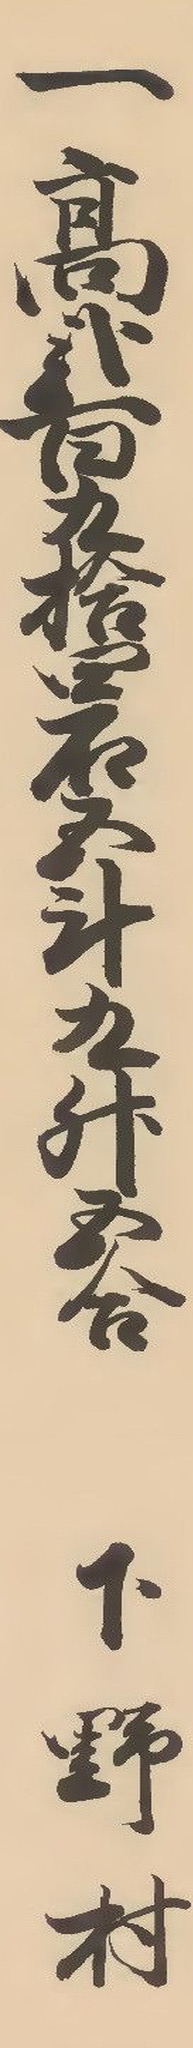一高弐百九拾四石五斗九升五合下野村
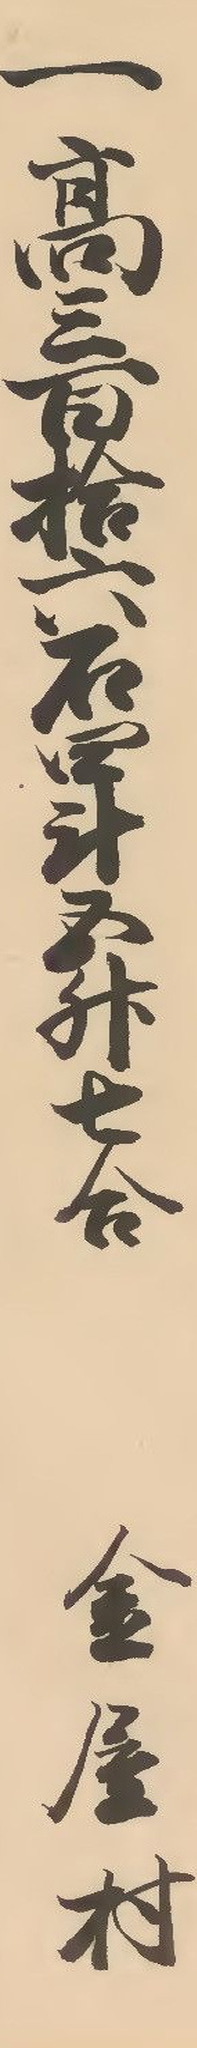一高三百拾六石四斗五升七合金屋村
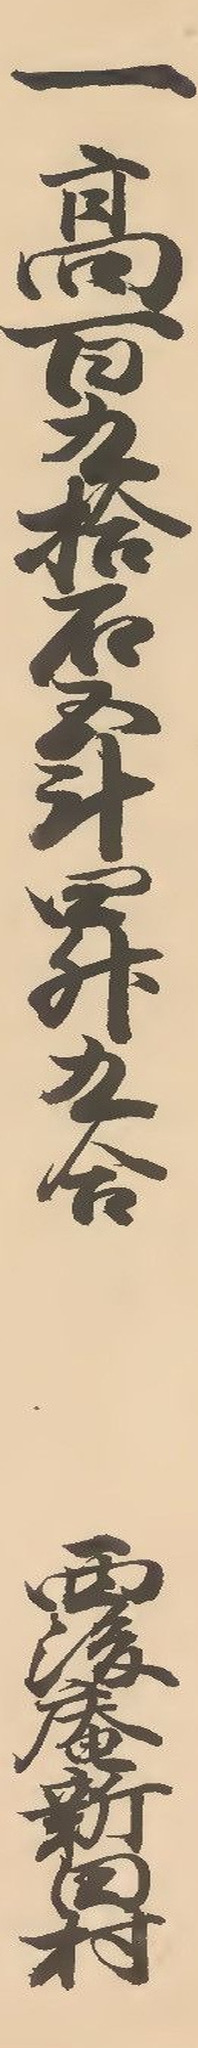一高百九拾石五斗四升九合西後庵新田村
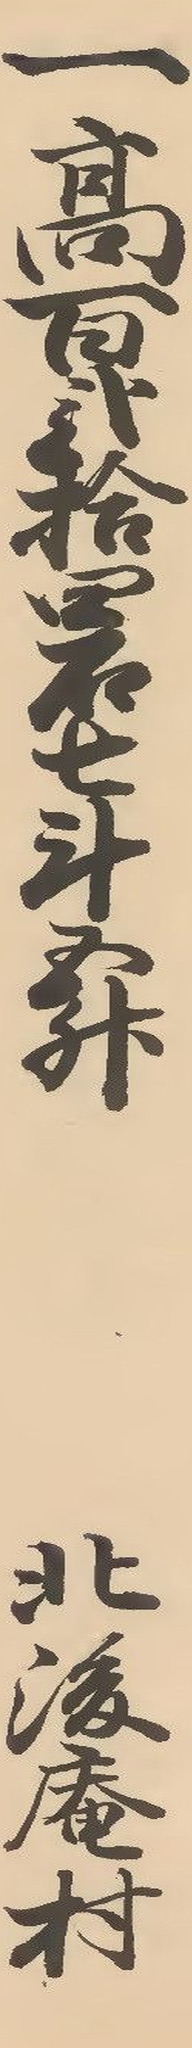一高百弐拾四石七斗五升北後庵村
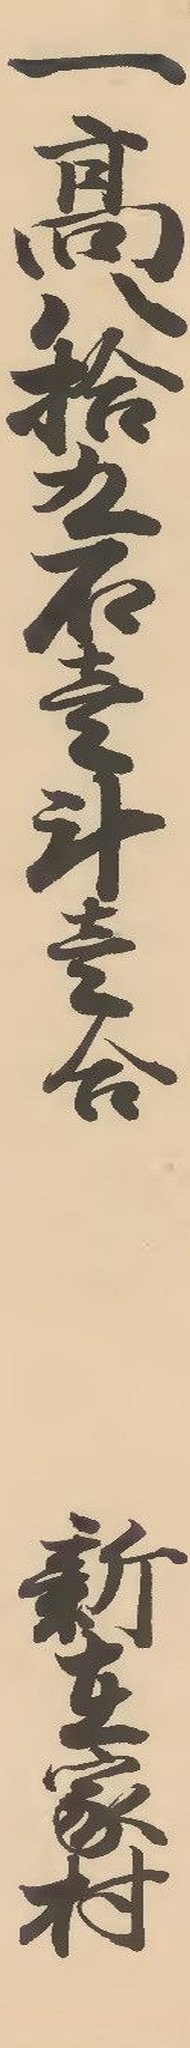一高八拾ｋ石壱斗壱合新在家村
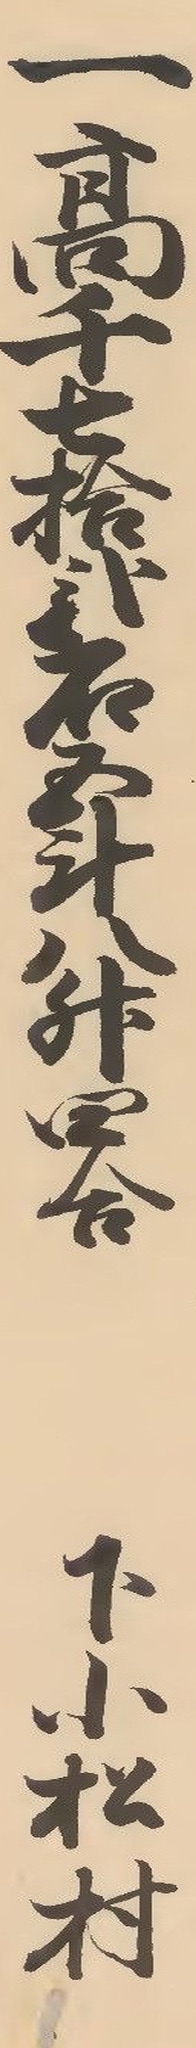一高千七拾弐石五斗八升四合下小松村
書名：陸奥国郷帳　１
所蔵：国立公文書館 National Archives of Japan
